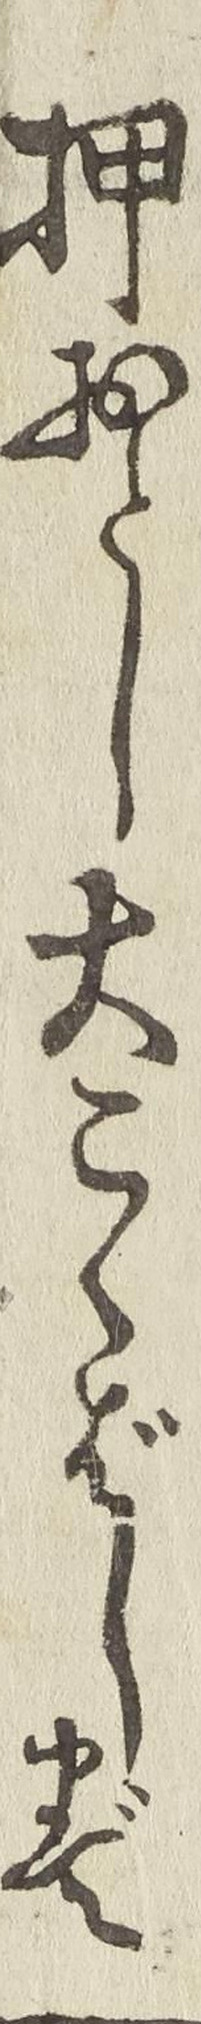押おとし大こくばしまで
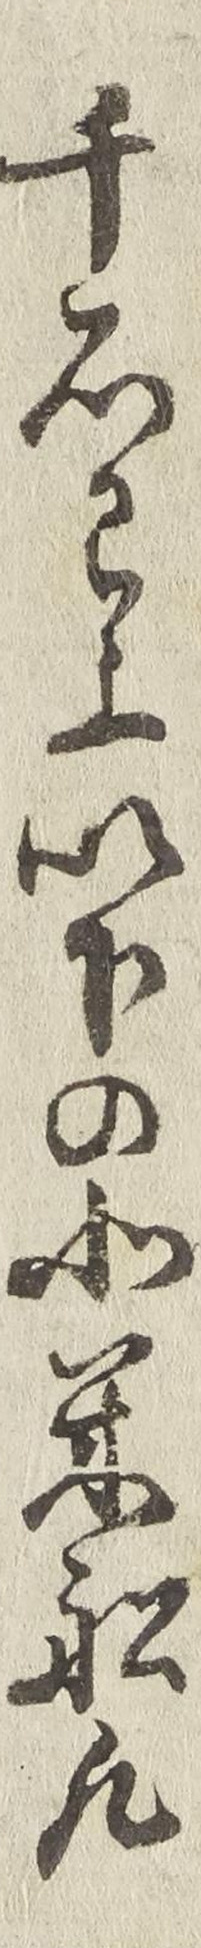千石已上以下の北米船凡
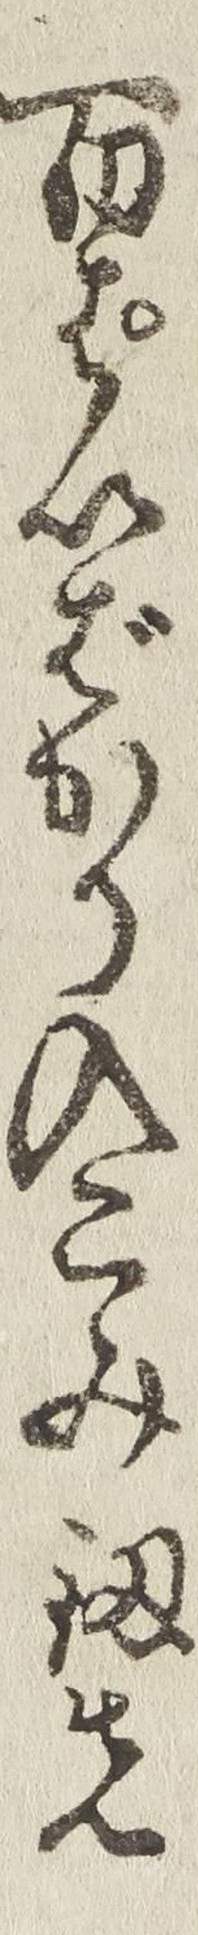百ぱいばかり入りこみ釼先
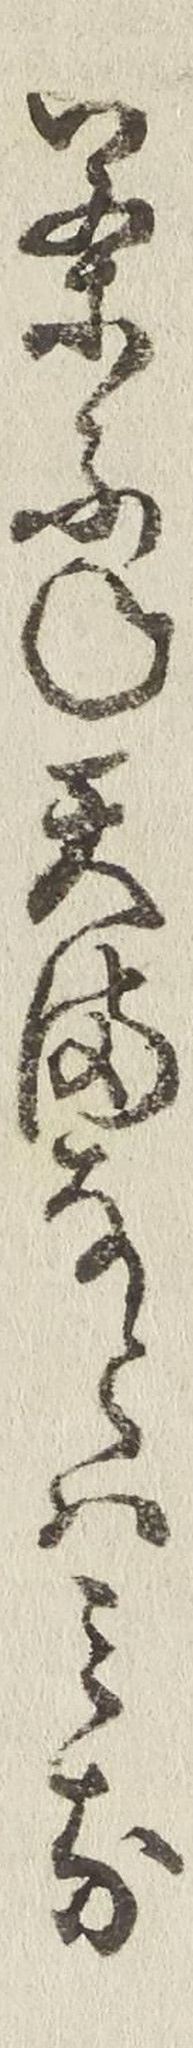茶ふね天満なとはみな
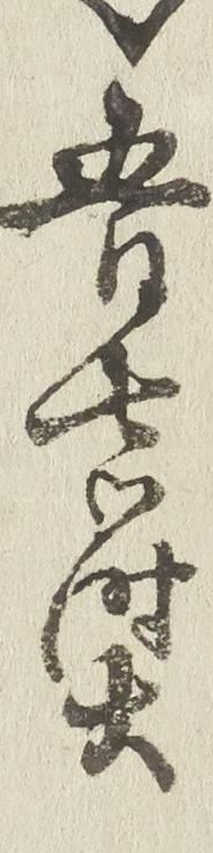五日七ツ時大
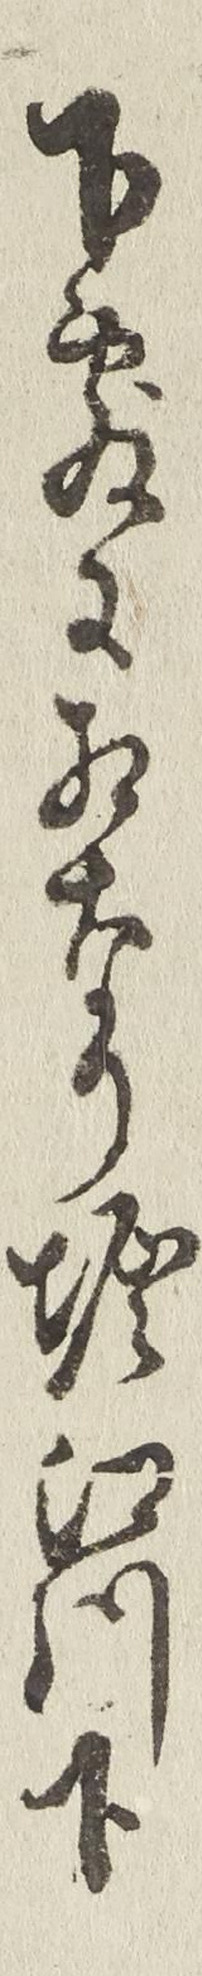下敷に相なり堀江川下
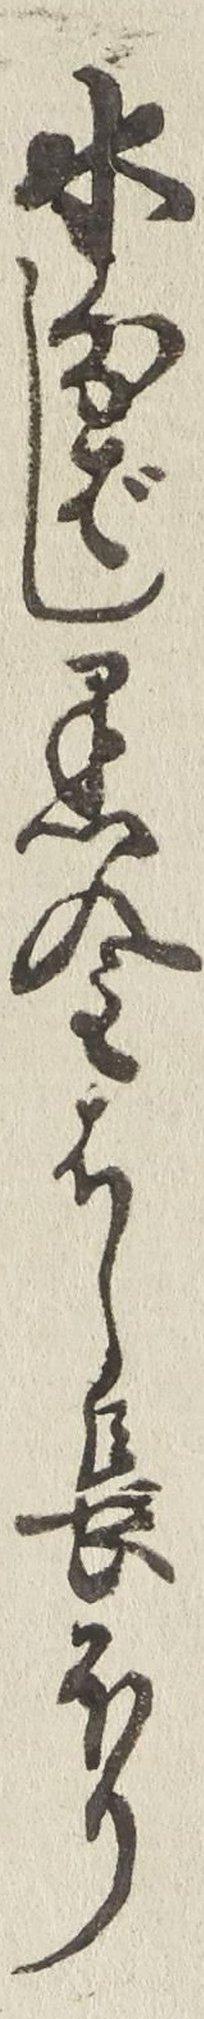水分ばし黒金はし長ほり
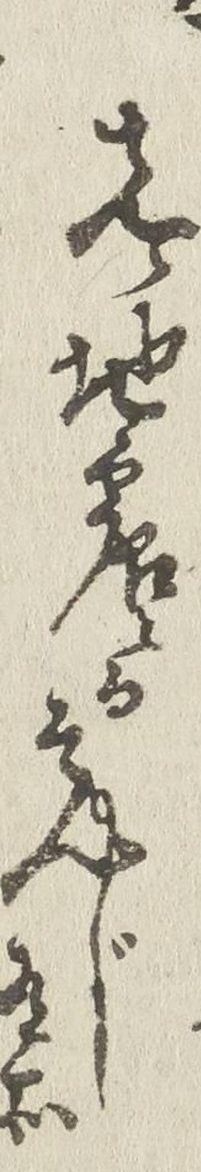先に地震にてそんじ有所
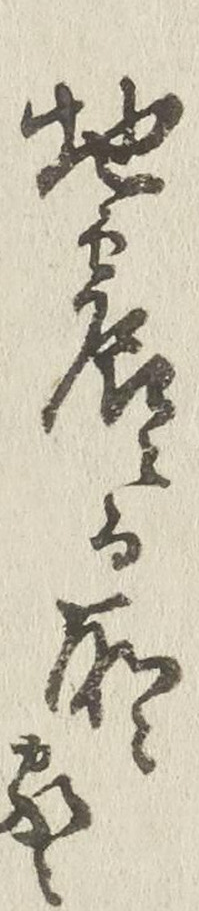地震にて所々家々
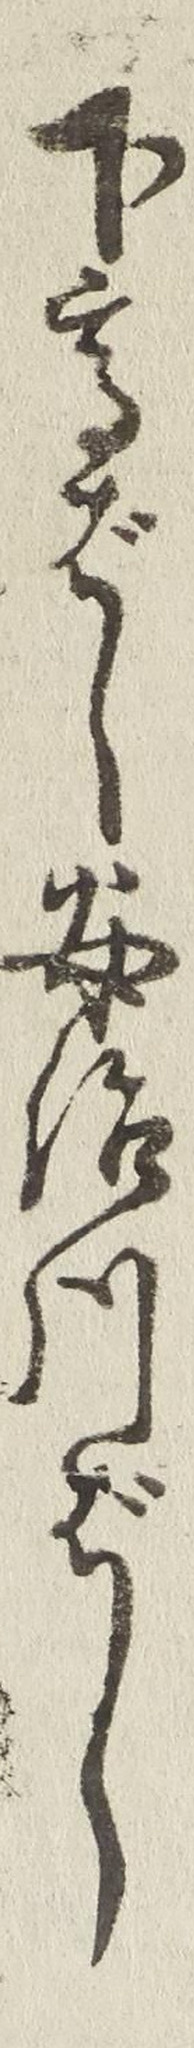下高はし安治川ばし
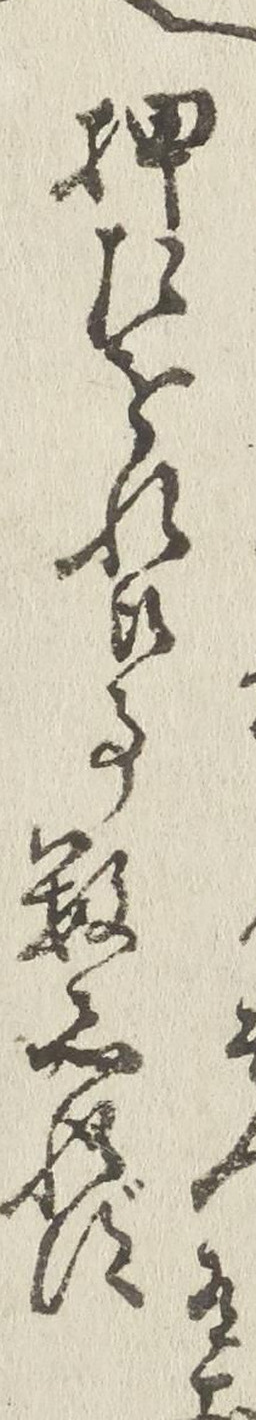押たをれる事数しれず
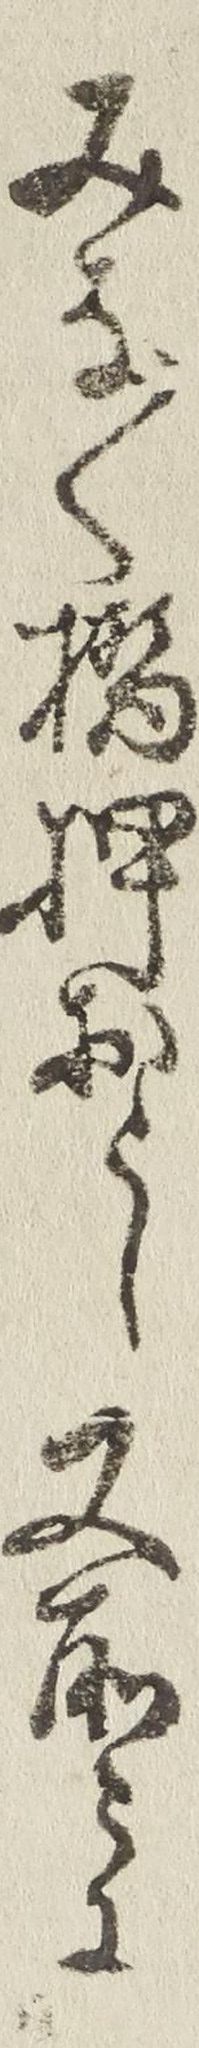みな〳〵橋押おとし又所々に
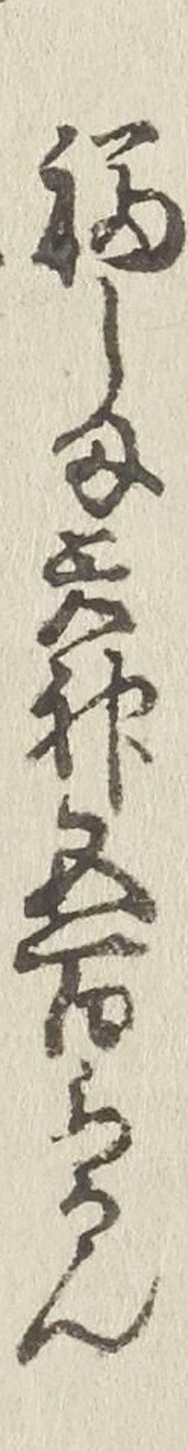福しま天神五百らかん
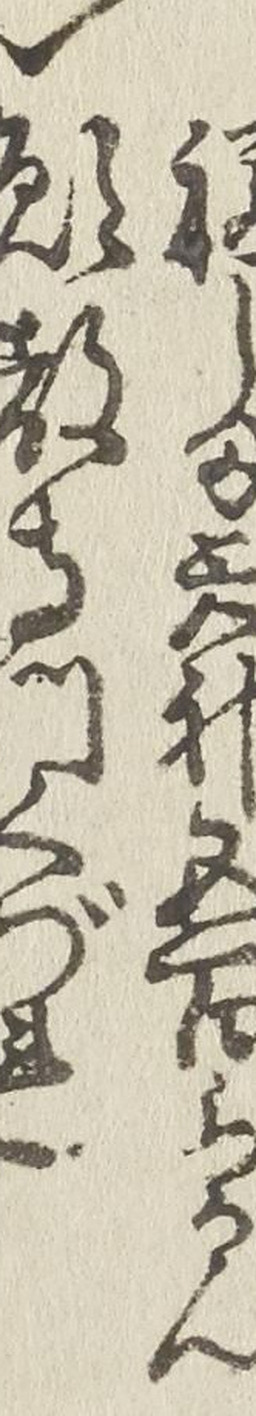願教寺門くずれ
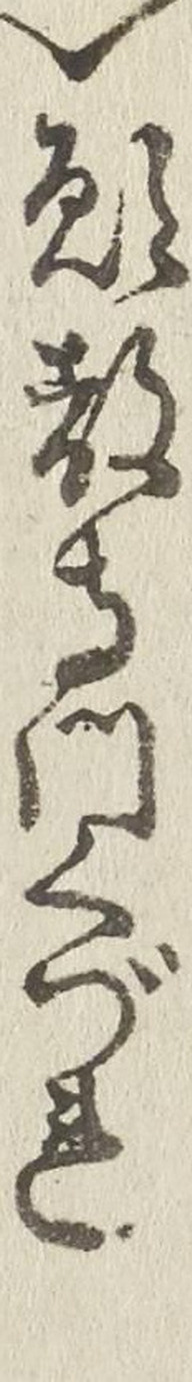願教寺門くずれ
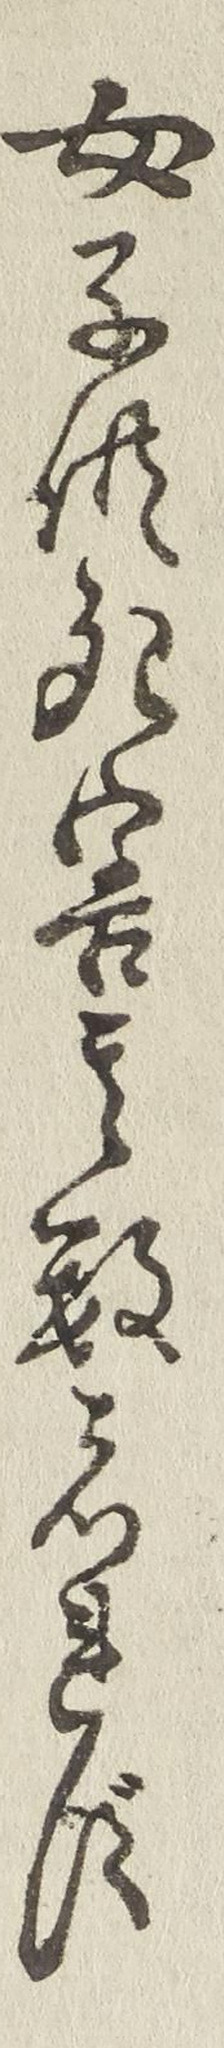女子供死害其数しれず
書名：嘉永七甲寅年十一月五日　攝津大津波次第
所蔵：東京大学地震研究所図書室 Earthquake Research Institute Library, The University of Tokyo, JAPAN
